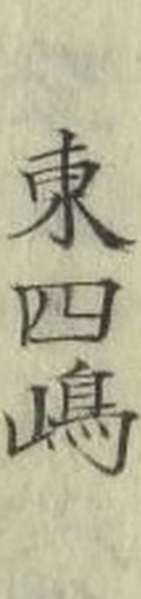東四嶋
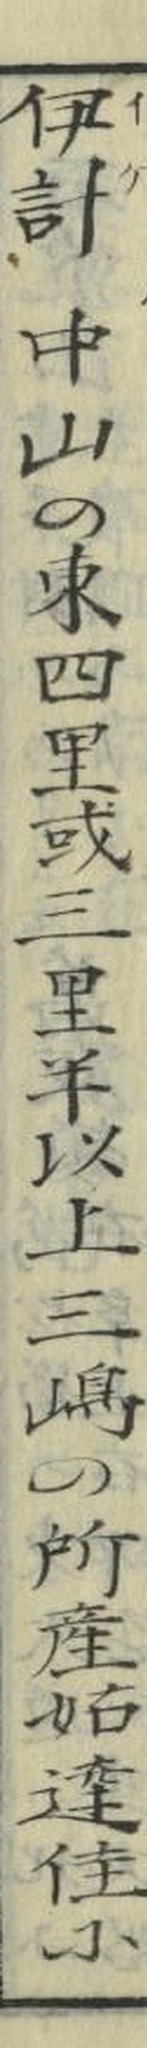伊計中山の東四里或三里半以上三嶋の所産姑達佳に
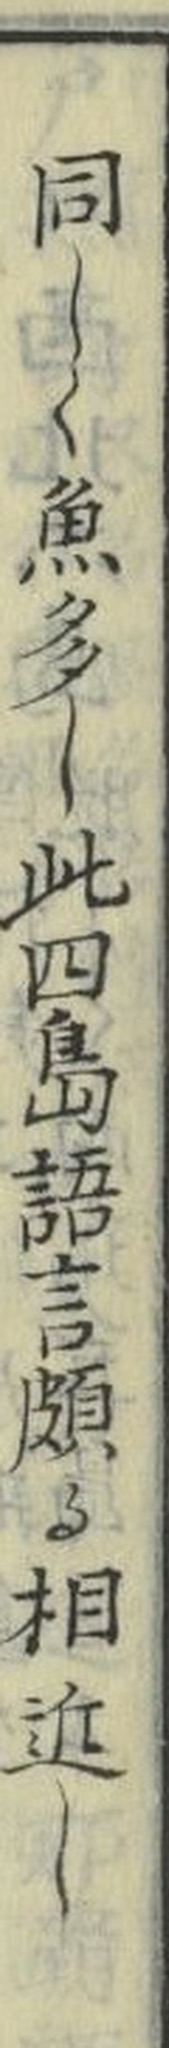同しく魚多し此四島語言頗る相近し
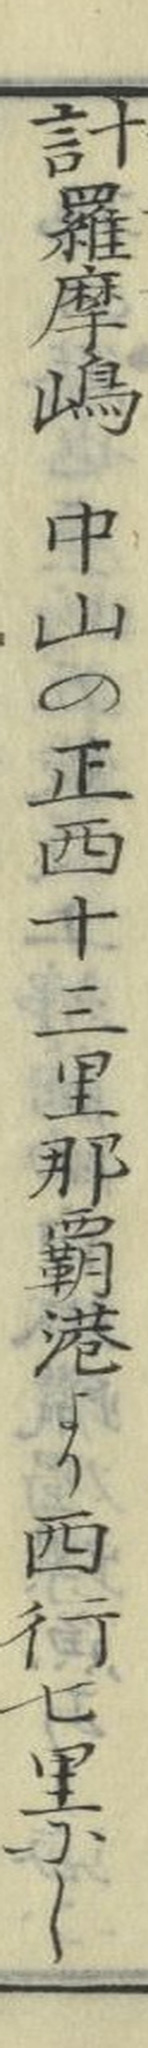計羅摩嶋中山の正西十三里那覇港より西行七里にし
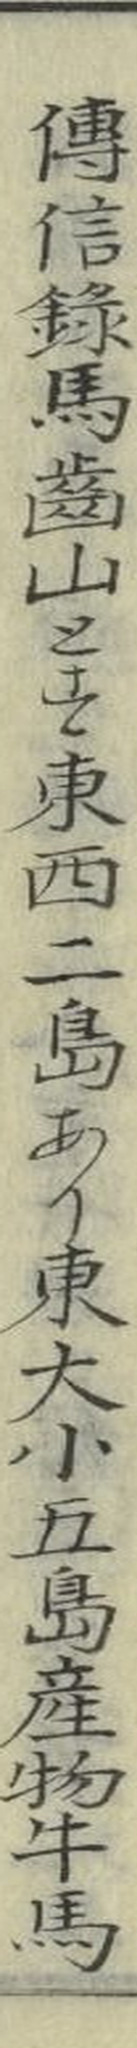伝信録馬歯山とす東西二島あり東大小五島産物牛馬
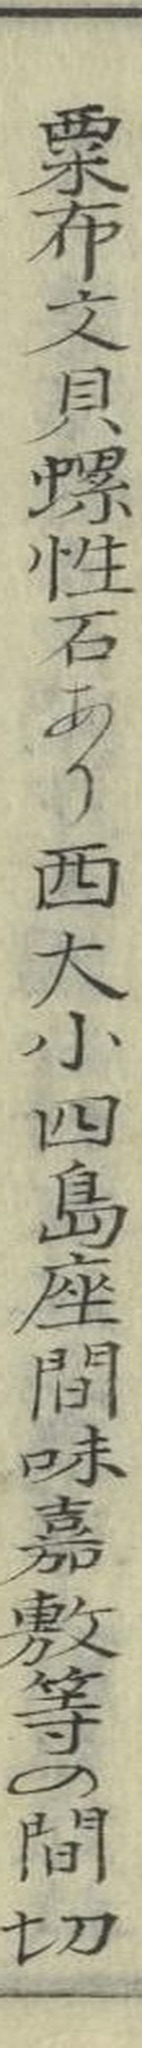粟布文貝螺性石あり西大小四島座間味嘉敷等の間切
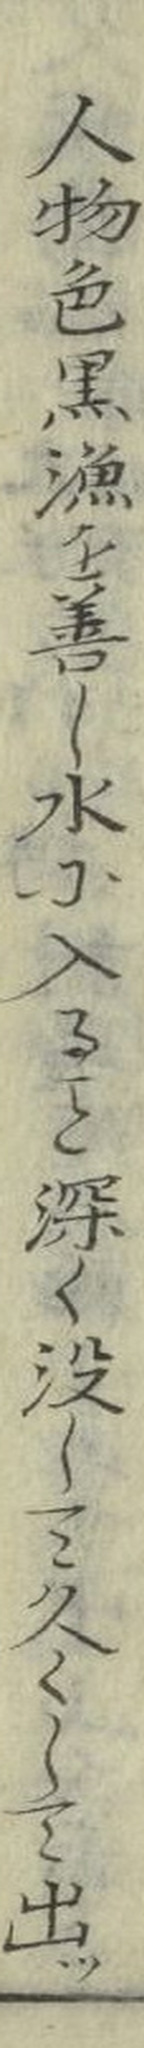人物色黒漁を善し水に入ること深く没して久くして出
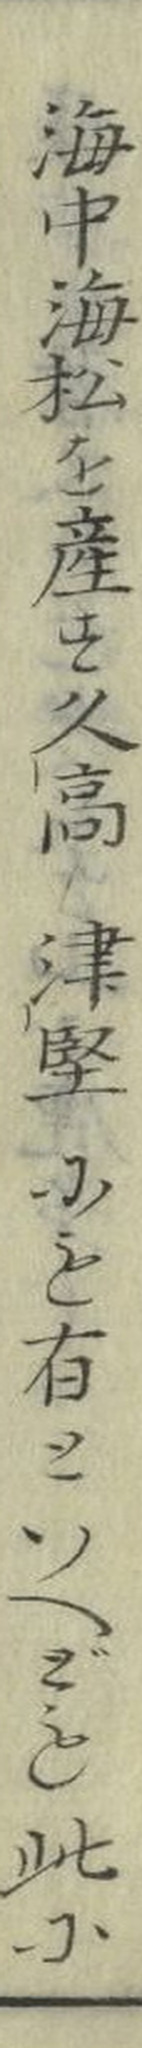海中海松を産す久-高津-堅にも有といへども此に

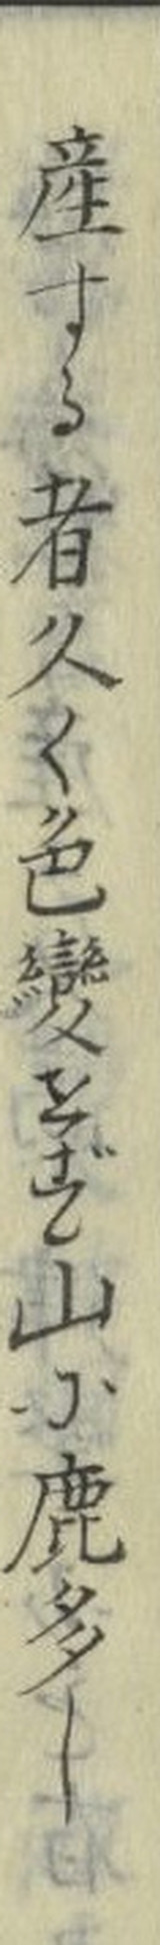産する者久く色変せず山に鹿多し
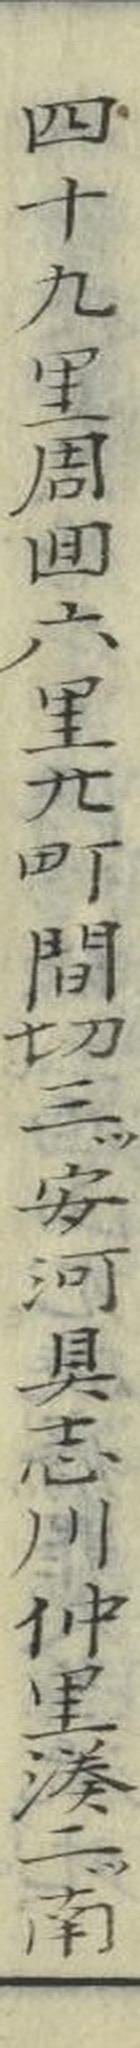四十九里周回六里廾町間切三安河具志川中里湊二南
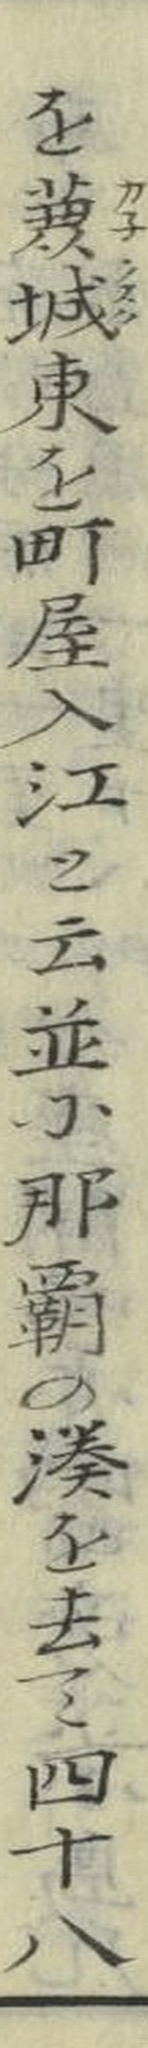を兼城東を町屋入江と云並に那覇の湊を去て四十八
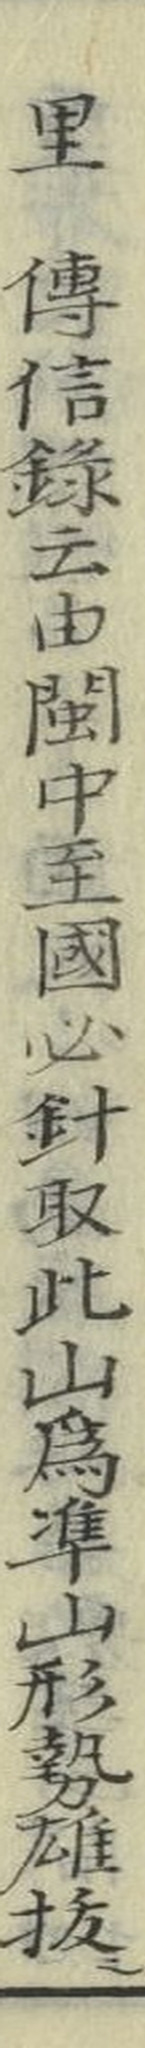里伝信録云由閩中至国必針取此山為準山形勢雄抜也
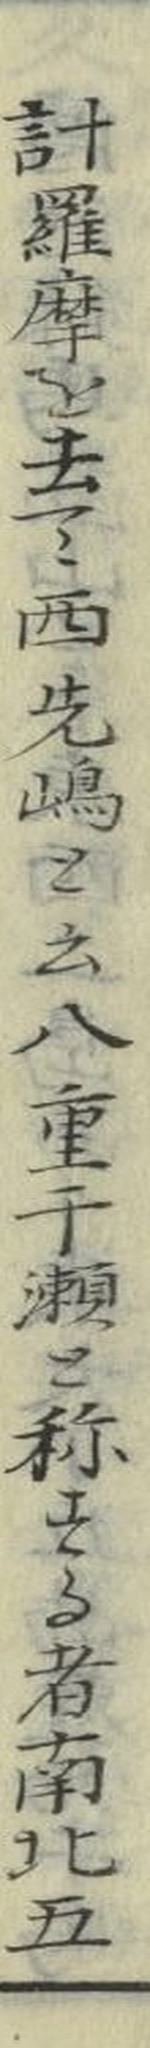計羅摩を去て西先嶋と云八重干瀬と称する者南北五
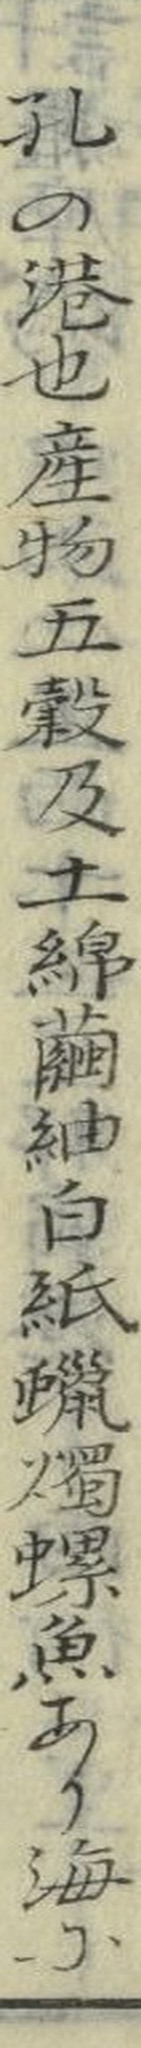孔の港也産物五穀及土綿繭油白紙蝋燭螺魚あり海に
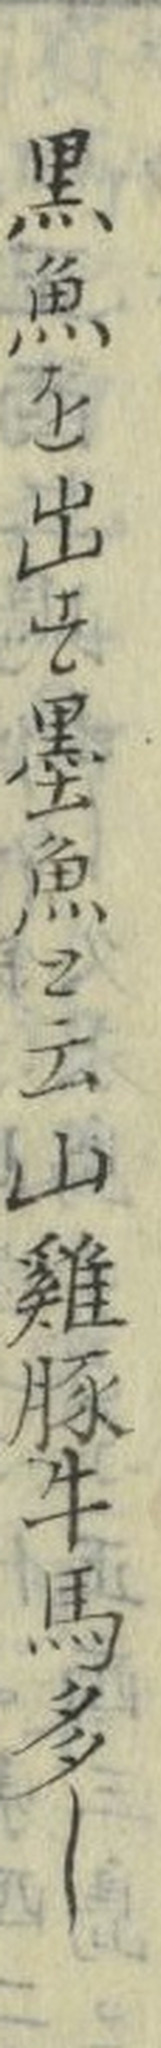黒魚を出す墨魚と云山鷄豚牛馬多し
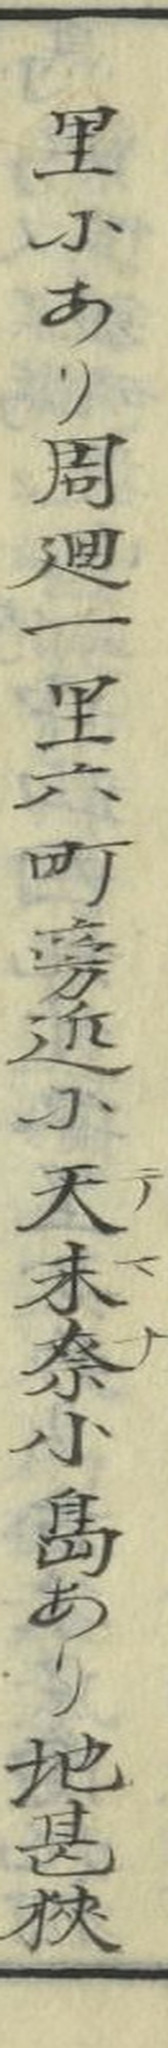里にあり周廻一里六町旁近に天未奈小島あり地甚狭
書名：琉球沿革志 上
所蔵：University of the Ryukyus Library
